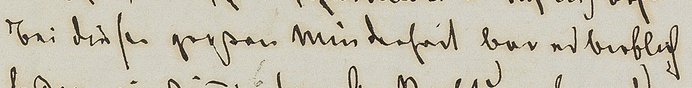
Bei dieser großen Minderheit war es wirklich
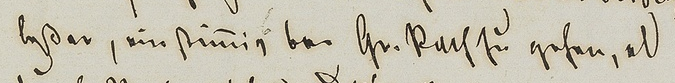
beßer, einstimmig vor Gr. Rath zu gehen, als
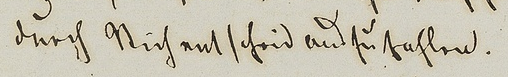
durch Stichentscheid auszuzahlen.
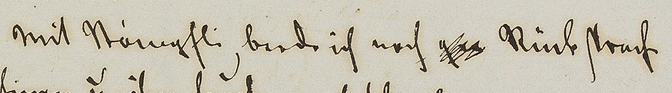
Mit Stämpfli werde ich noch gar Rücksprache
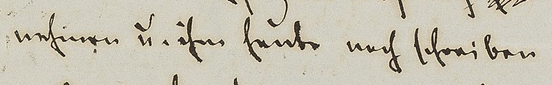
nehmen u. ihm heute noch schreiben.
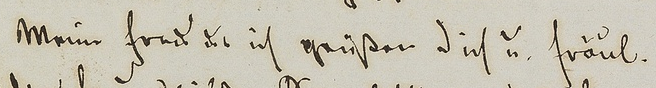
Meine Frau u. ich grüßen dich u. Fräul.
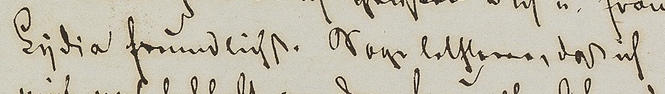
Lydia freundlichst. Sage letzterer, daß ich
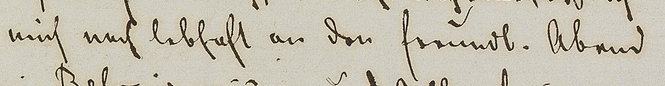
mich noch lebhaft an den freundl. Abend
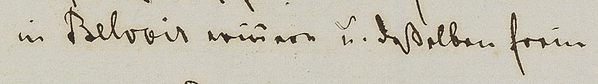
in Belvoir erinnere u. deßelben freue.
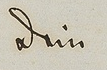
Dein
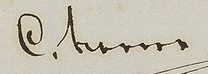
C. Karrer
